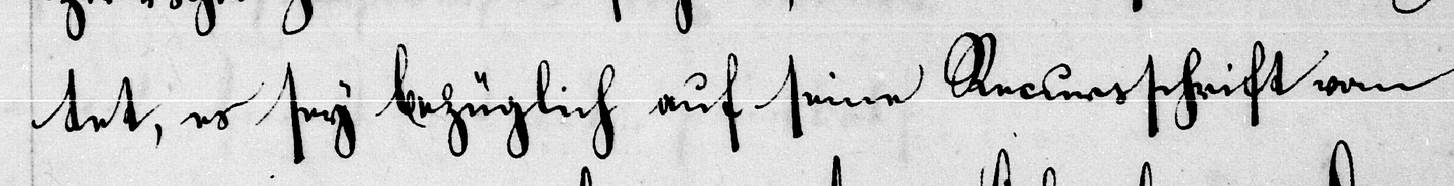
tet, es sey bezüglich auf seine Recursschrift vom
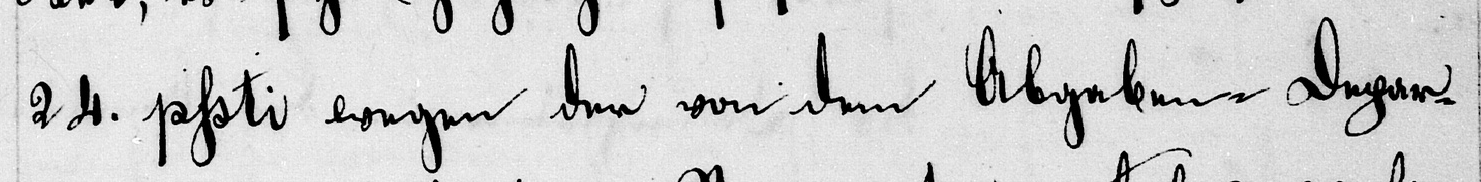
24. pssti wegen der von dem Abgaben-Depar¬
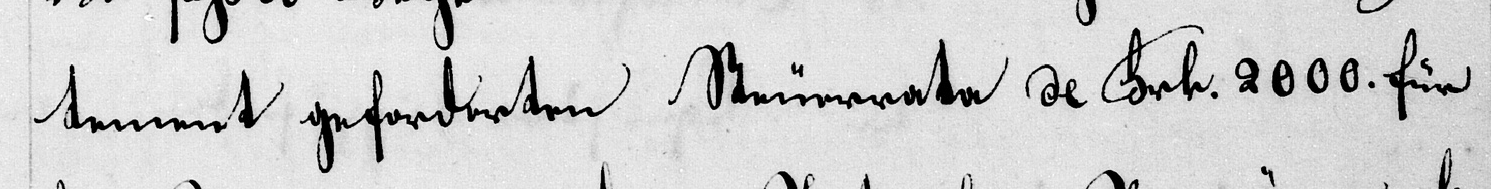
tement geforderten Steuerrata de Frk. 2000. für
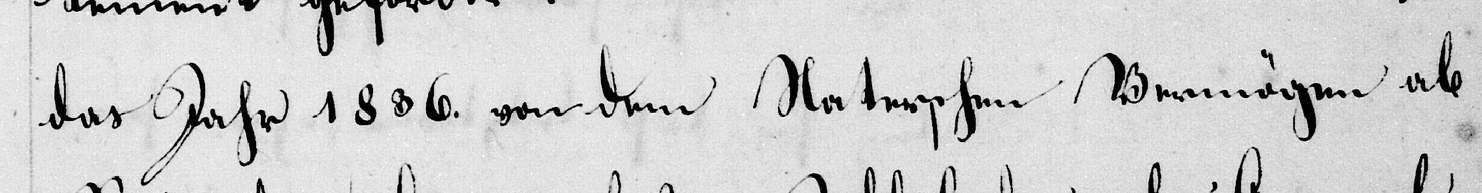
das Jahr 1836. von dem Naterschen Vermögen ab
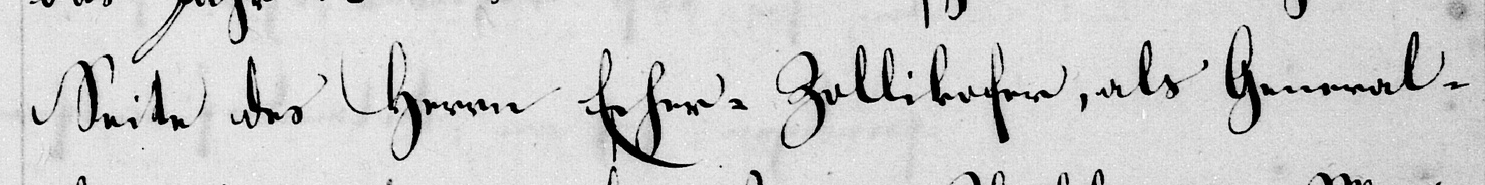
Seite des Herrn Escher-Zollikofer, als General¬
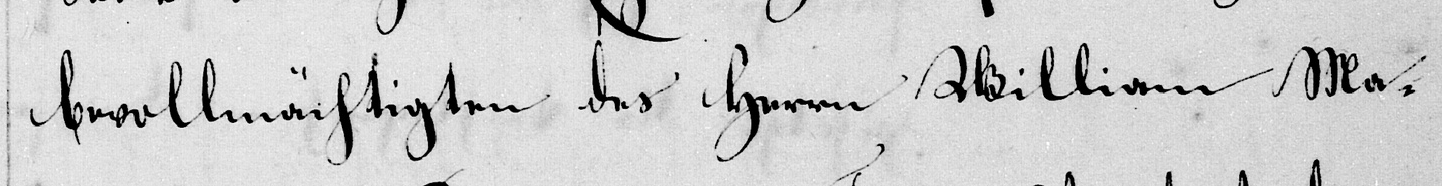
bevollmächtigten des Herrn William Ma¬
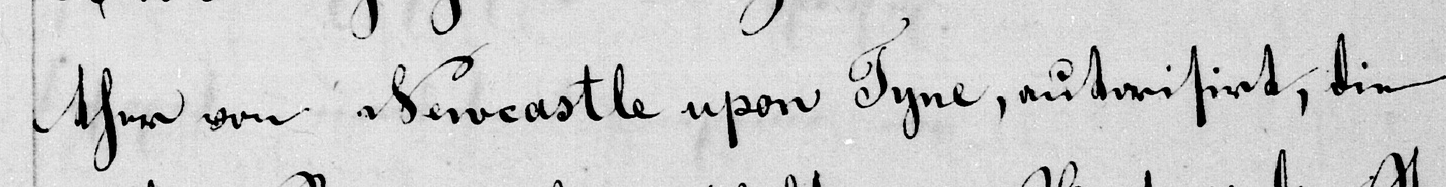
ther von Newcastle upon Tyne, autorisirt, die
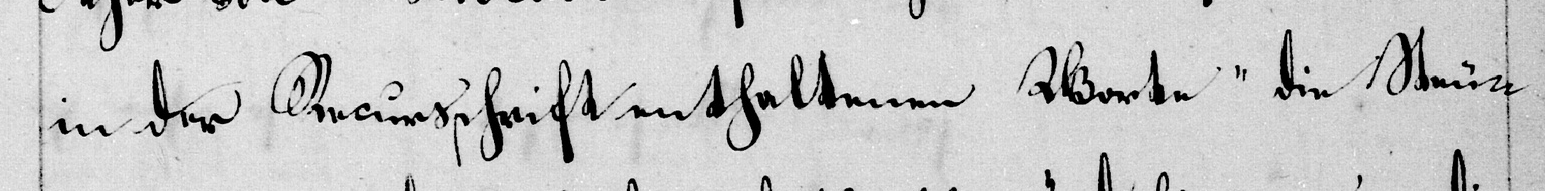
in der Recursschrift enthaltenen Worte „die Steu¬
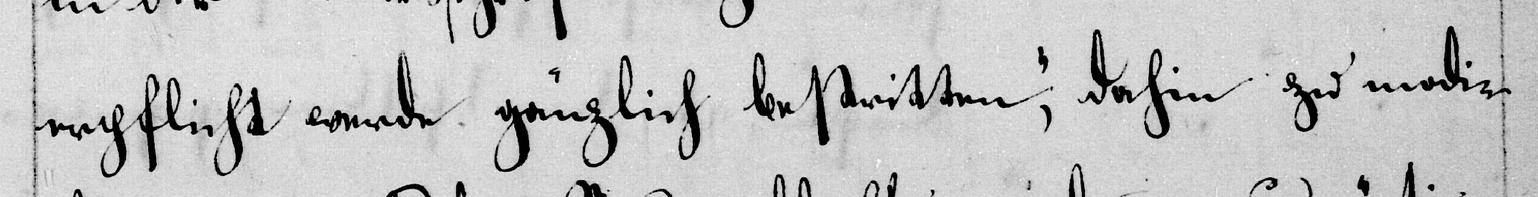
erpflicht werde gänzlich bestritten“, dahin zu modi¬
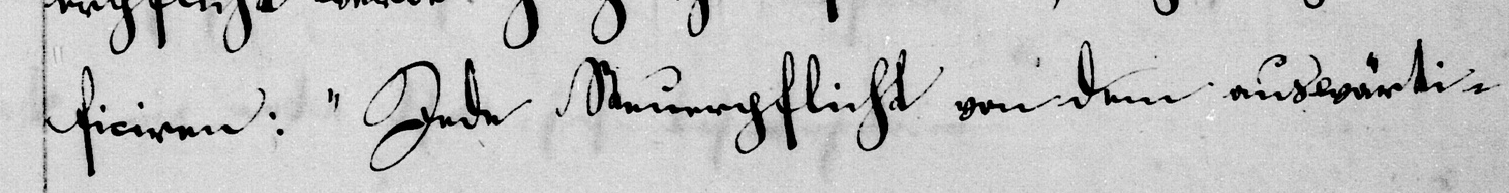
ficiren: „Jede Steuerpflicht von dem auswärti-
